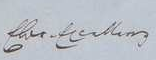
Ewr Excellenz
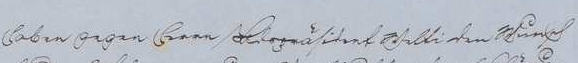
haben gegen Herrn Bdspräsident Welti den Wunsch
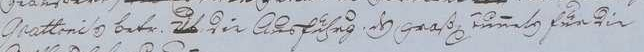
Grattoni's betr. Üb die Ausführg. des großen Tunnels für die
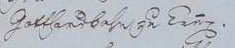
Gotthardbahn zu kennen.
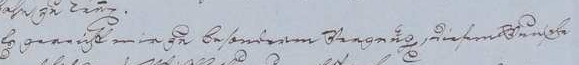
Es gereicht mir zu besonderm Vergnügen, diesem Wunsche
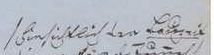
Ihinsichtlich der Bauzeit
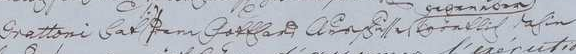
beanspruchen würde, dem Gotthard Ausschusse gegenüber
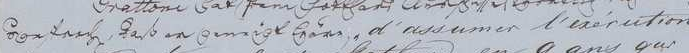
ausgesprochen, daß er geneigt wäre, «d'assumer l'exécution
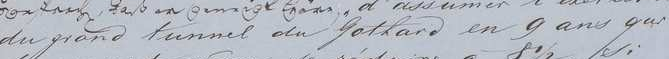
du grand tunnel du Gothard en 9 ans qui
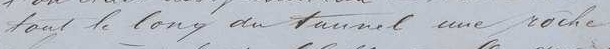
tout le long du tunnel une roche
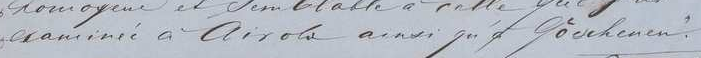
examinée à Airolo ainsi qu'à Göschenen.»
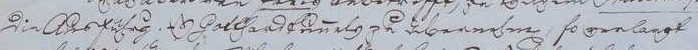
die Ausführg. des Gotthardtunnels zu übernehmen, so verlangt
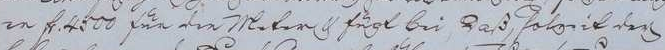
er fr. 4500 für den Meter & fügt bei, daß, soweit der
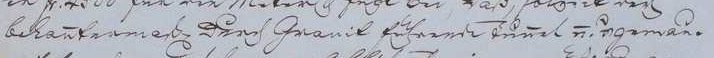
bekanntermaßen durch Granit führende Tunnel nicht ausgemau-
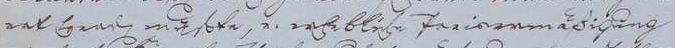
ert werden müßte, e. erhebliche Preisermäßigung
